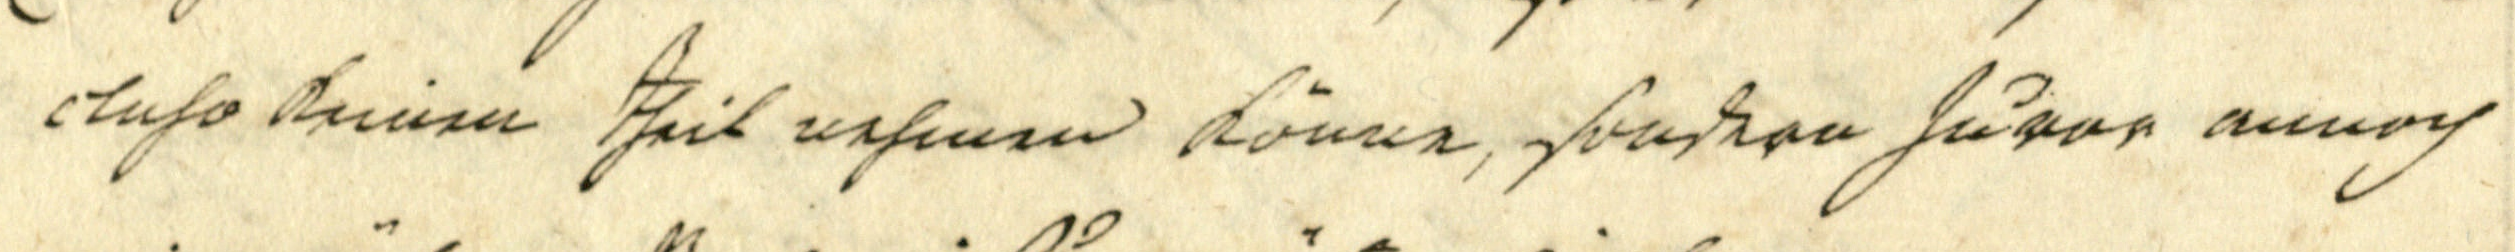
cluso keinen Theil nehmen könne, sondern zuvor annoch
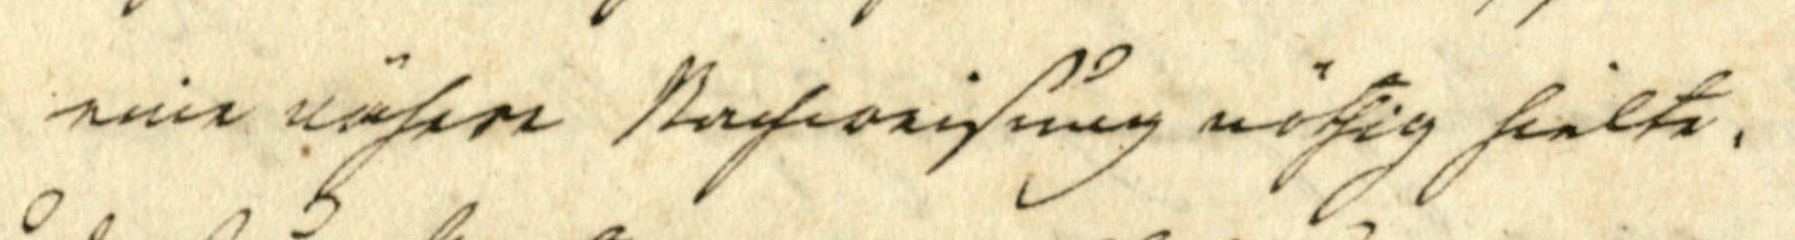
eine nähere Nachweisung nöthig hielte.
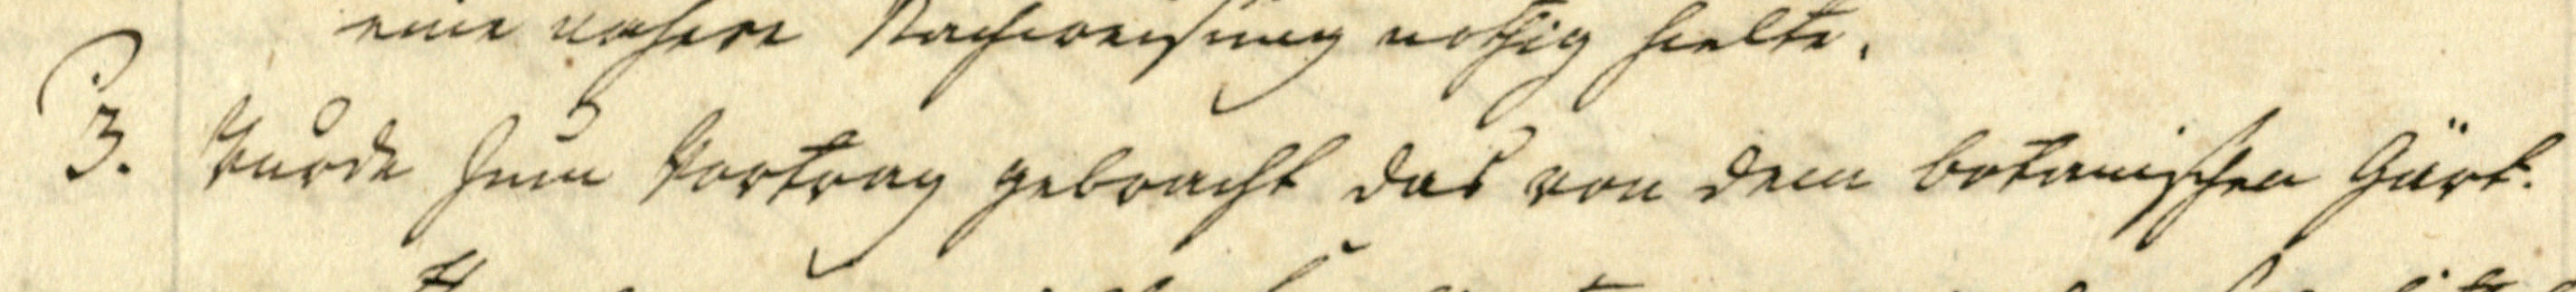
3. Wurde zum Vortrag gebracht das von dem botanischen Gärt¬
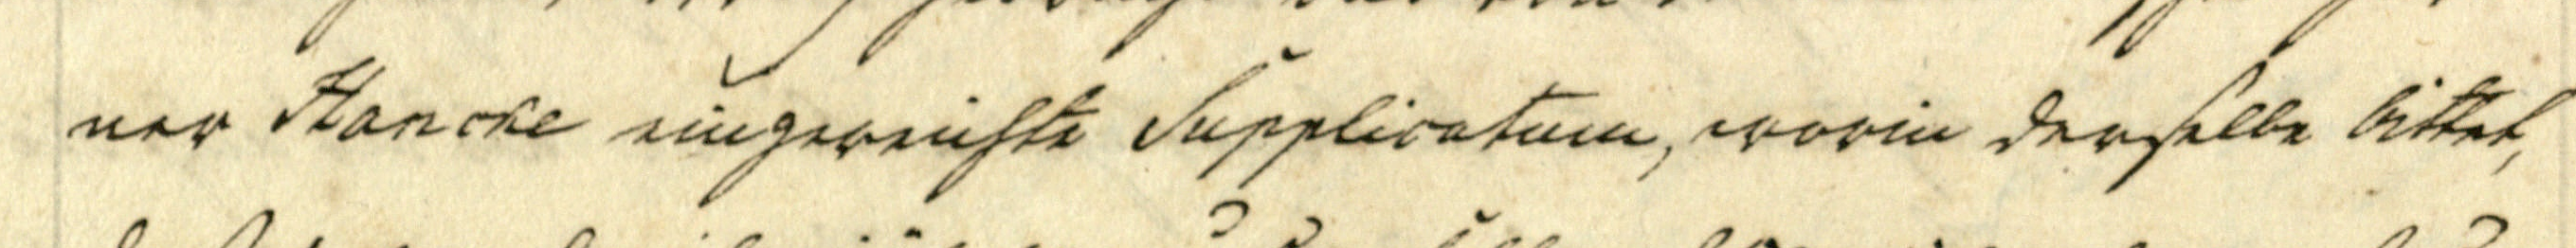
ner Hancke eingereichte Supplicatum, worin derselbe bittet,
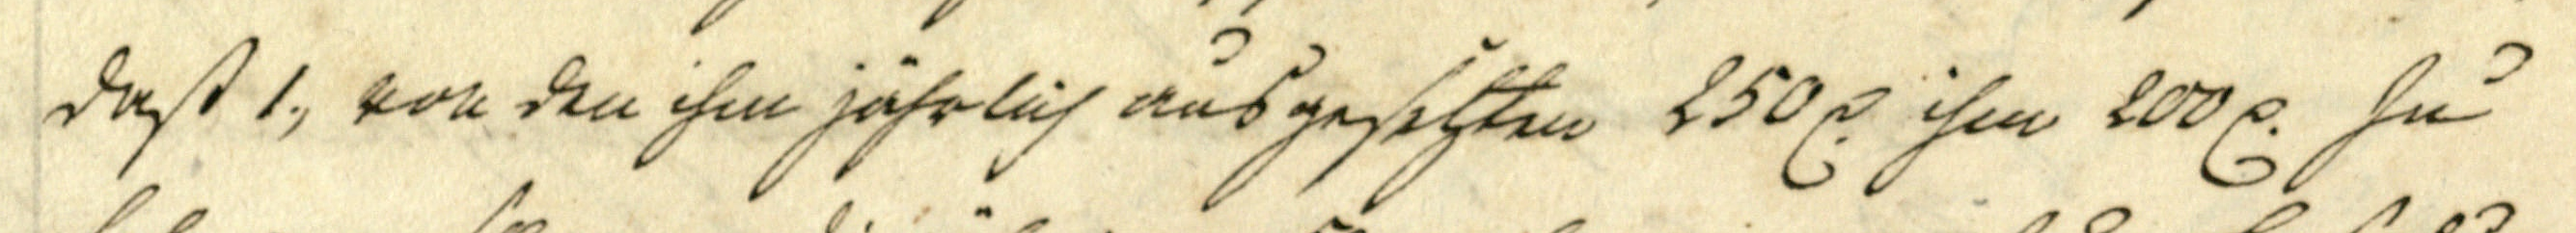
daß 1., von den ihm jährlich aus gesetzten 250 l. ihm 200 l. zu
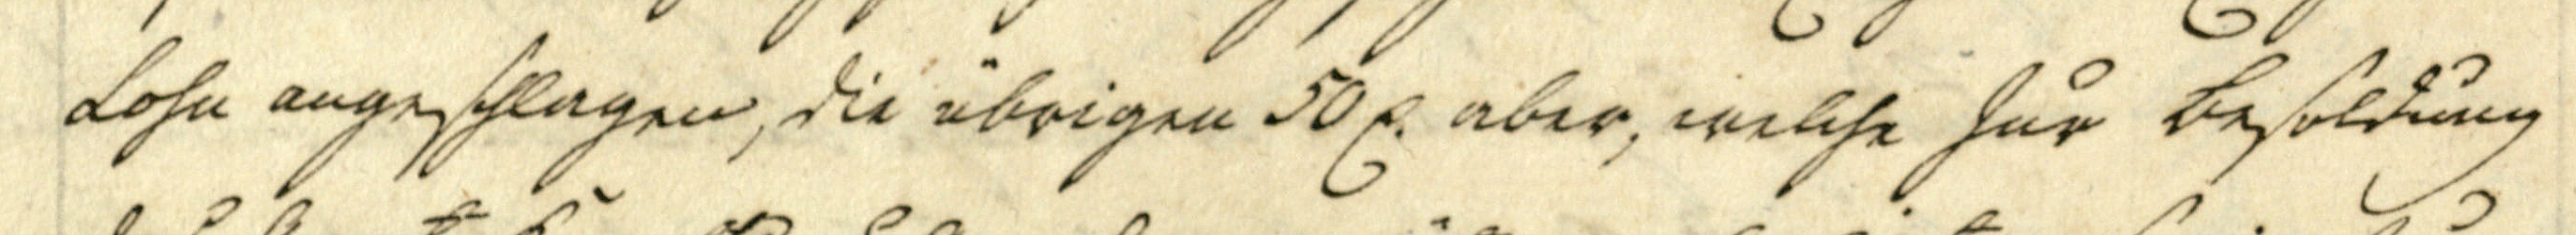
Lohn angeschlagen, die übrigen 50 l. aber, welche zur Besoldung
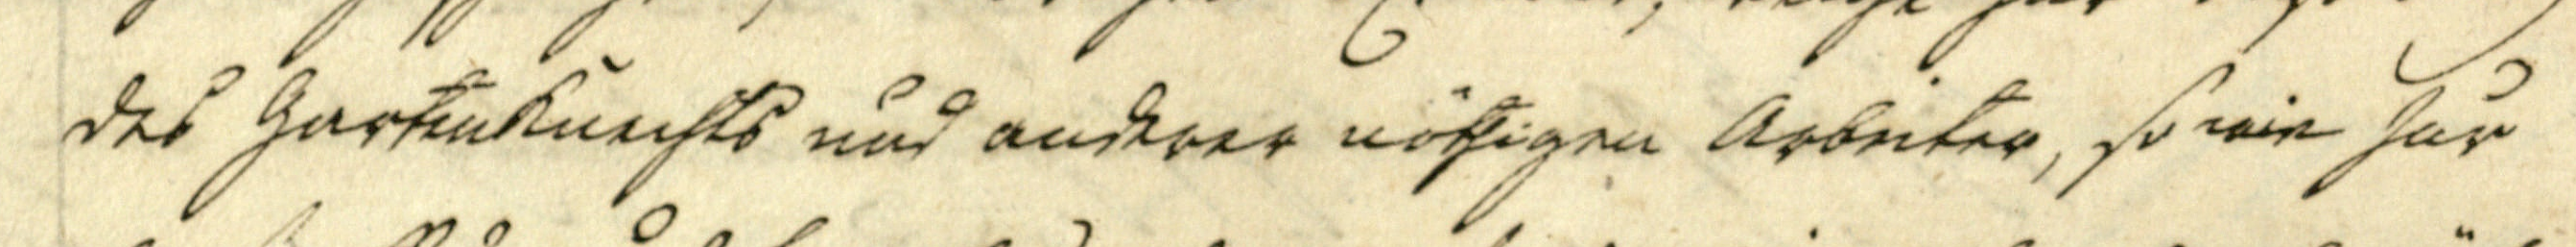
des Gartenknechts und anderer nöthigen Arbeiter, so wie zur
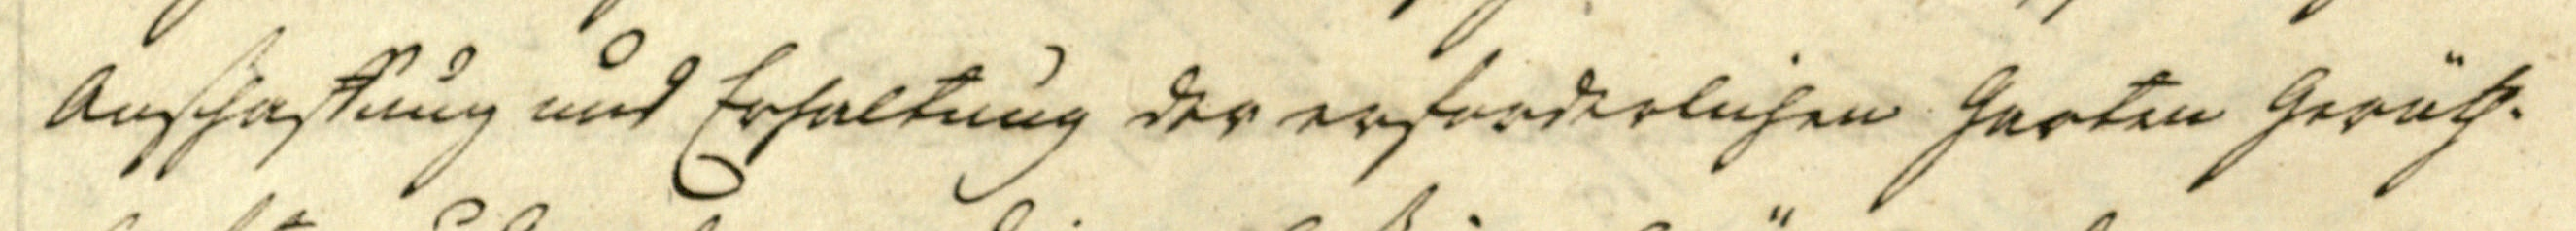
Anschaffung und Erhaltung der erforderlichen Garten Geräth¬
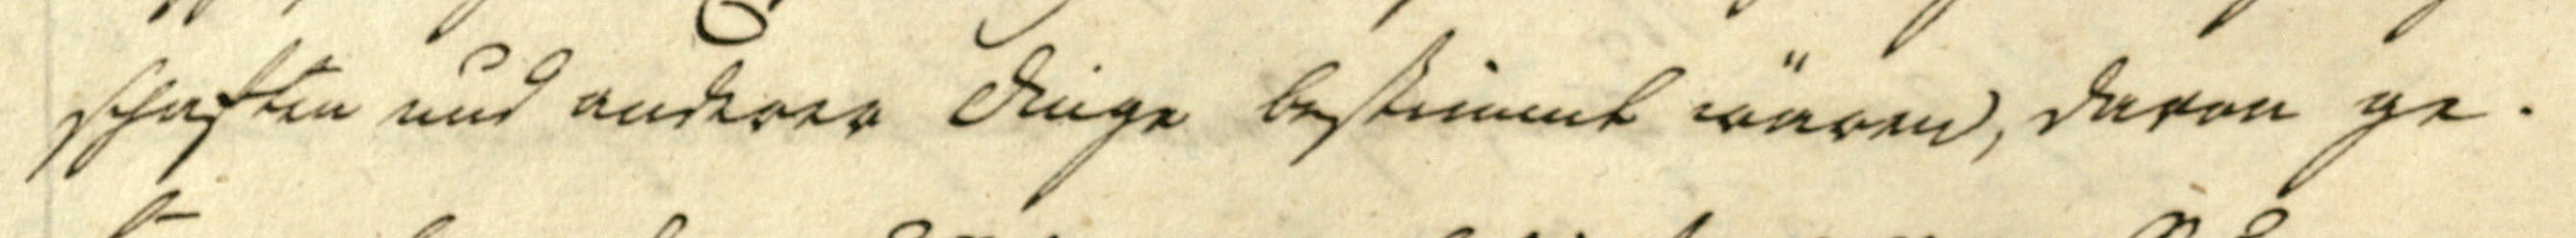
schaften und anderer Dinge bestimmt wären, davon ge¬
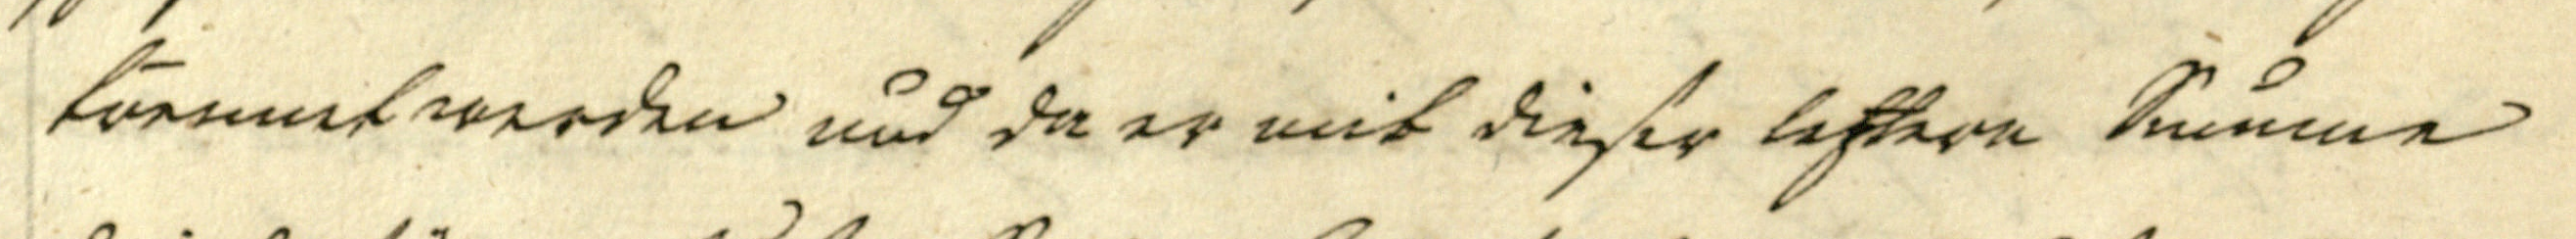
trennt werden und da er mit dieser letztern Summe
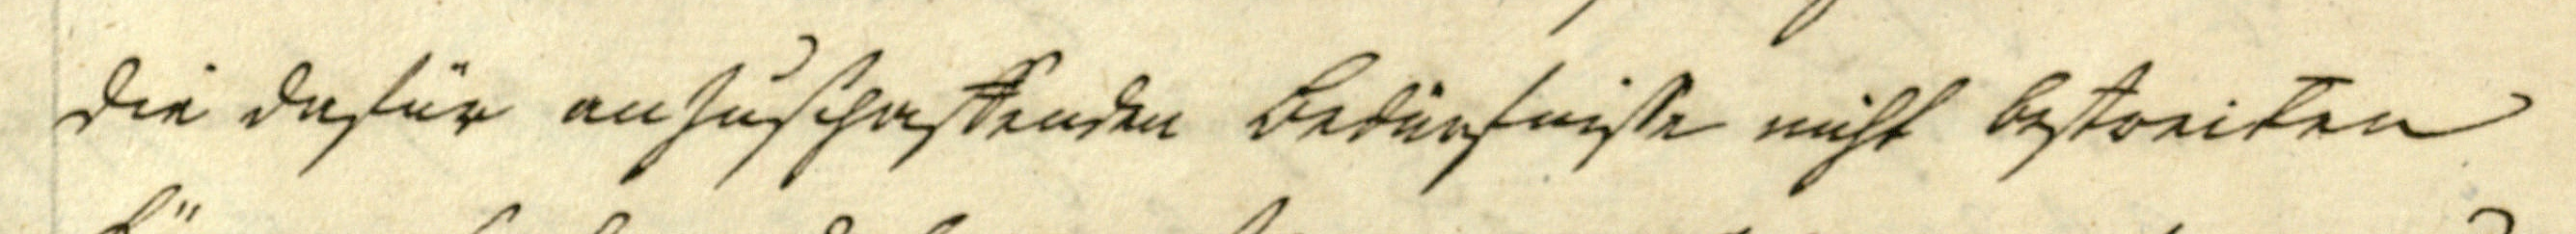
die dafür anzuschaffenden Bedürfnisse nicht bestreiten
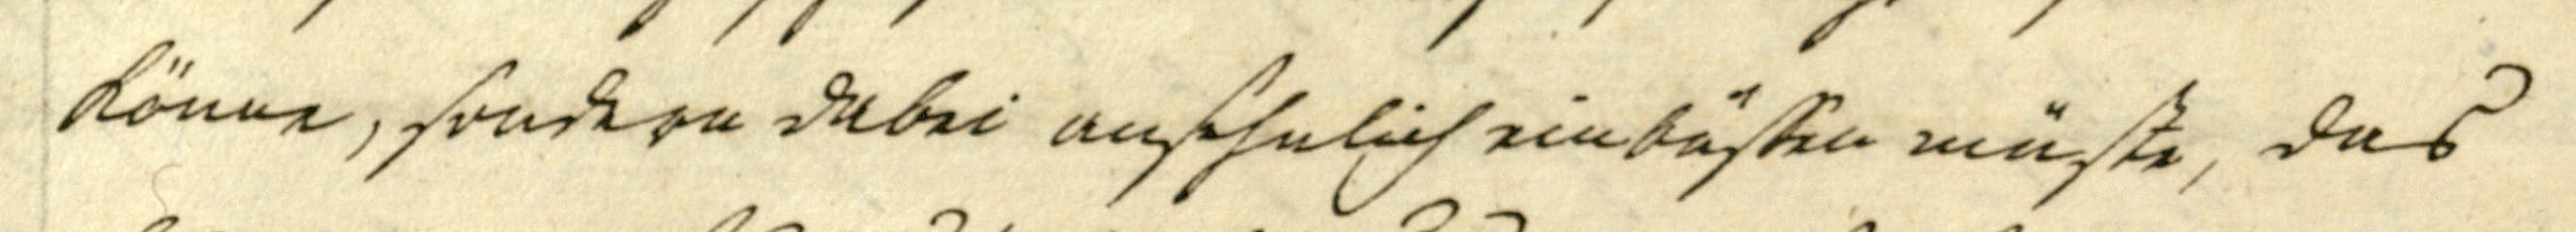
könne, sondern dabei ansehnlich einbüssen müßte, das
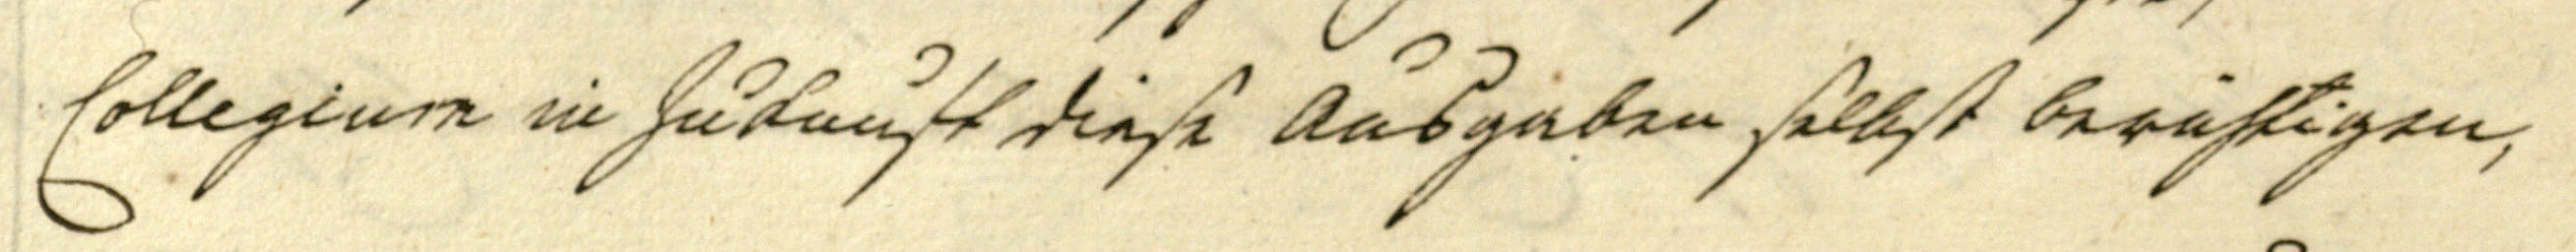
Collegium in Zukunft diese Ausgaben selbst berichtigen,
